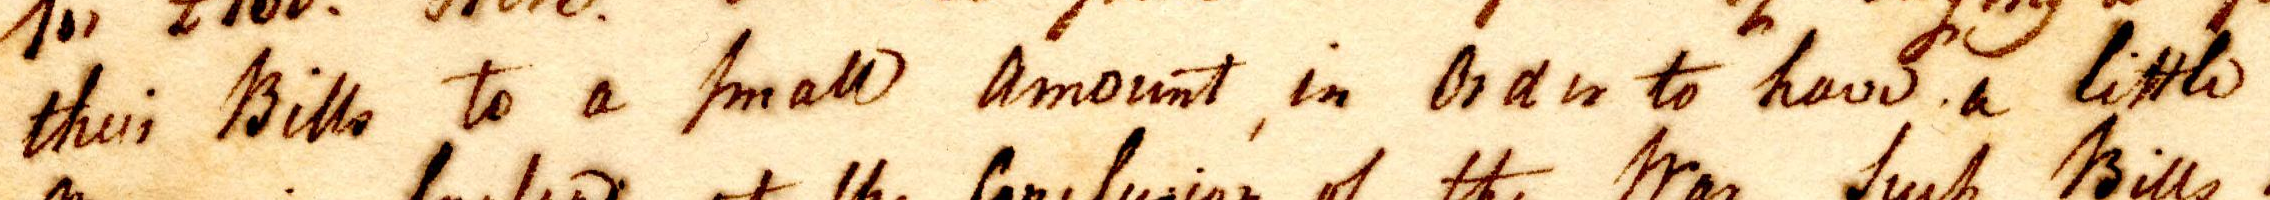their Bills to a small Amount in Order to have little
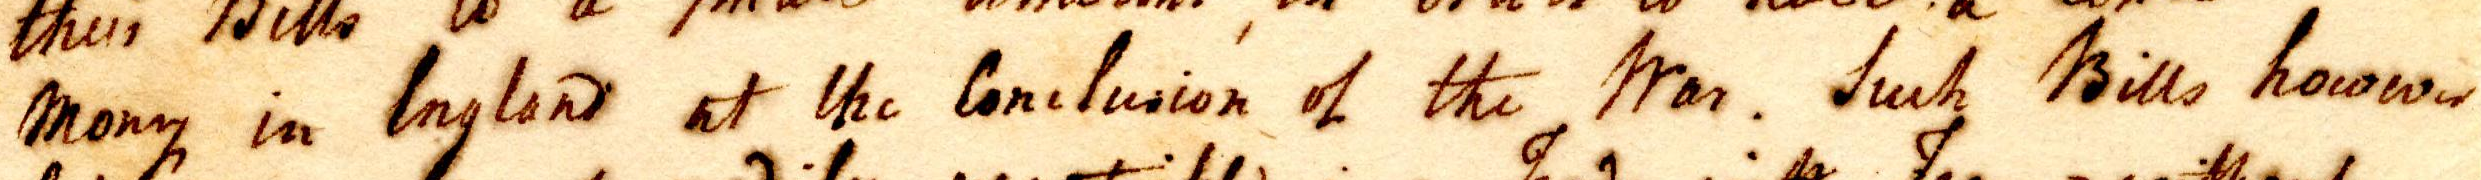Money in England at the Conclusion of the War. Such Bills however
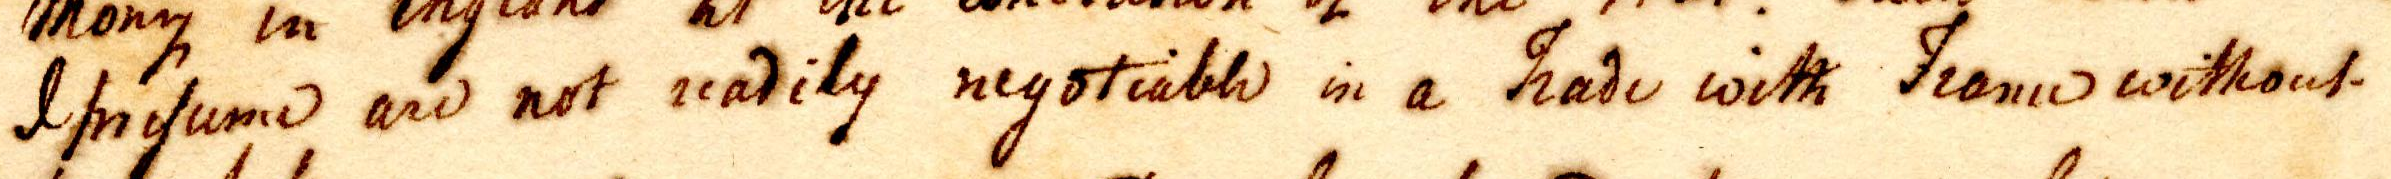I presume are not readily negotiable in a Trade with France without
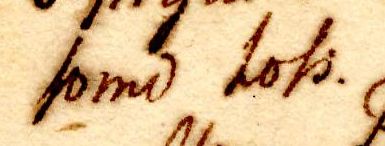some Loss.
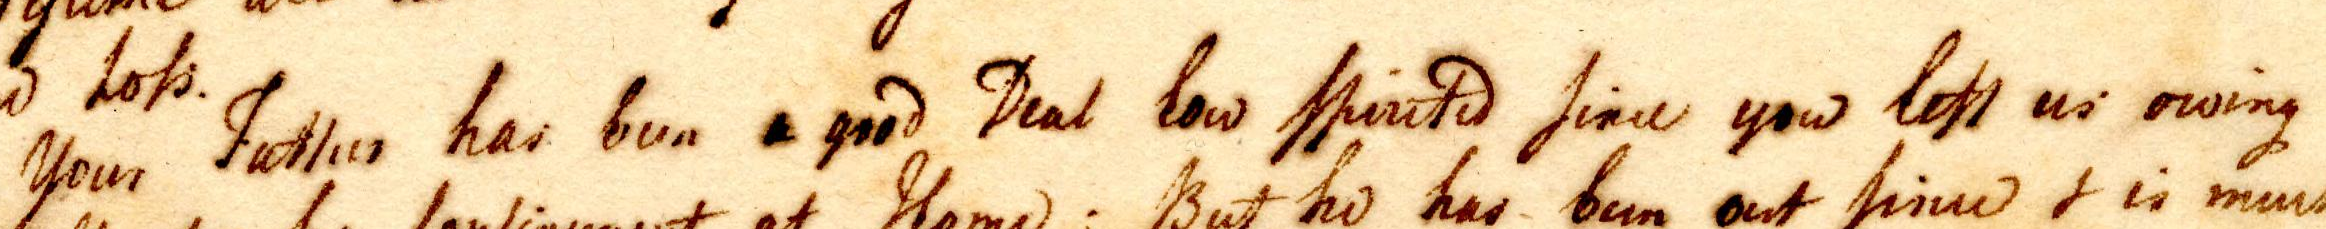Your Father has been a good Deal low spirited since you left us owing
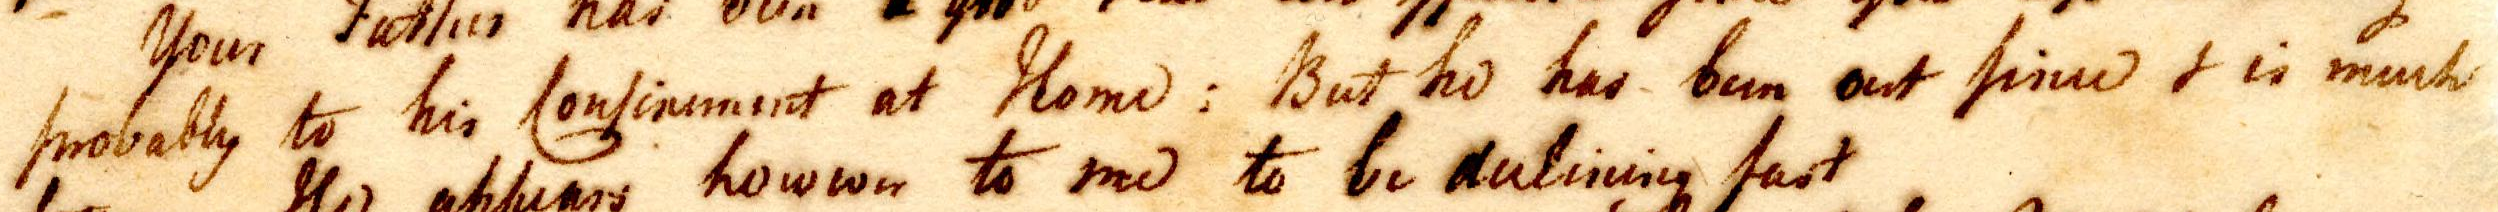probably to his Confinement at Home: But he has been out since & is much
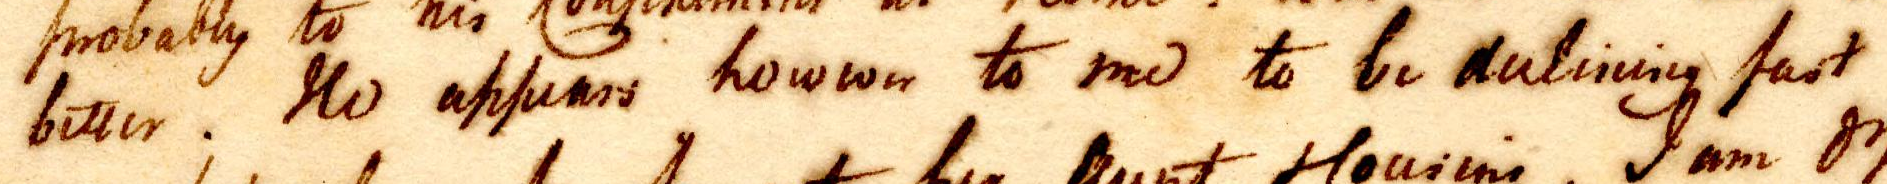better. He appears however to me to be declining fast
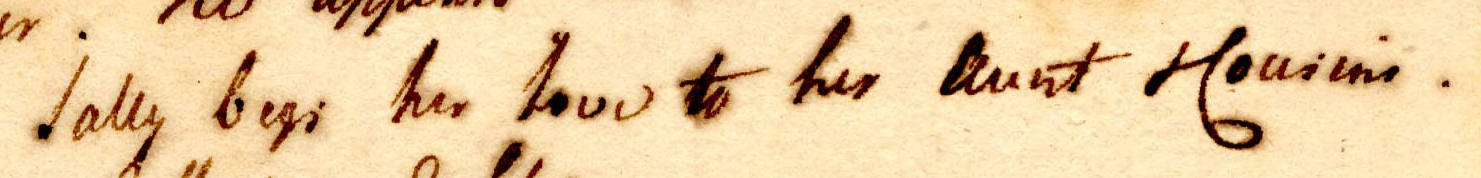Sally begs her Love to her Aunt & Cousins.
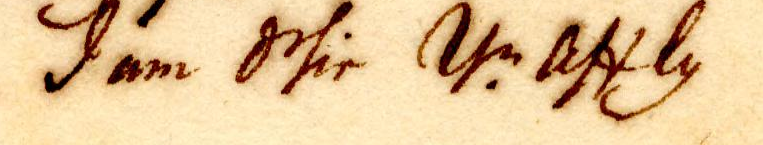I am D^r Sir Y^r Affly.
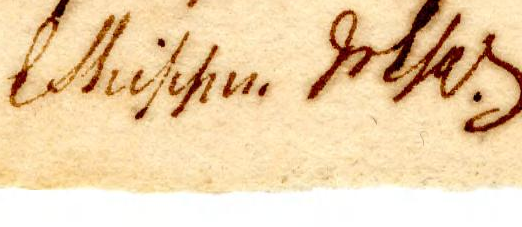E Shippen J. Esq^r
